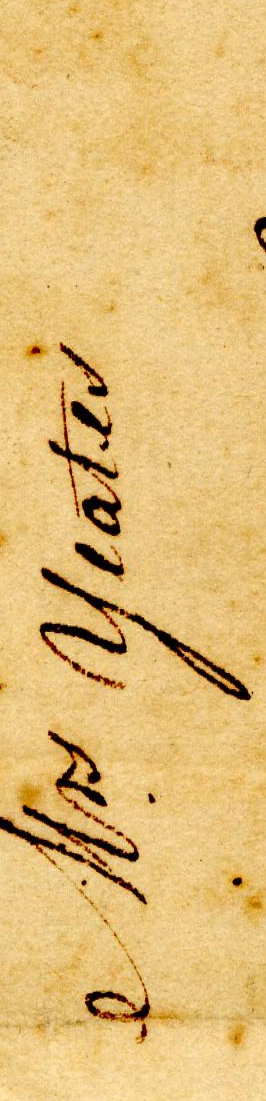M^rs. Yeates
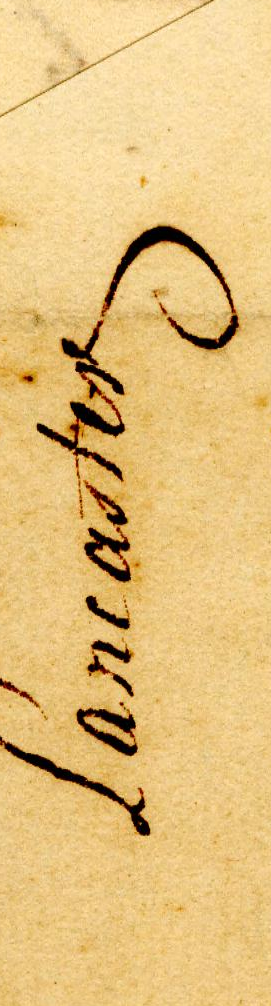Lancaster
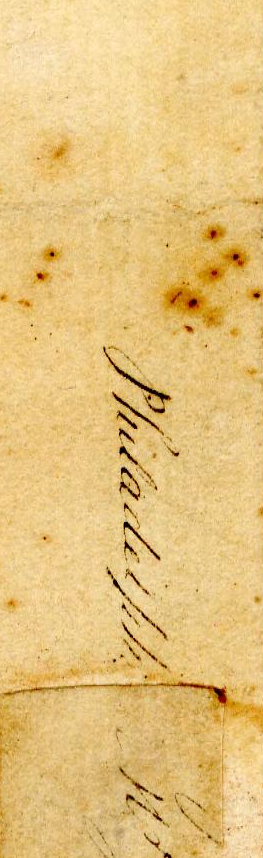Philadelph-
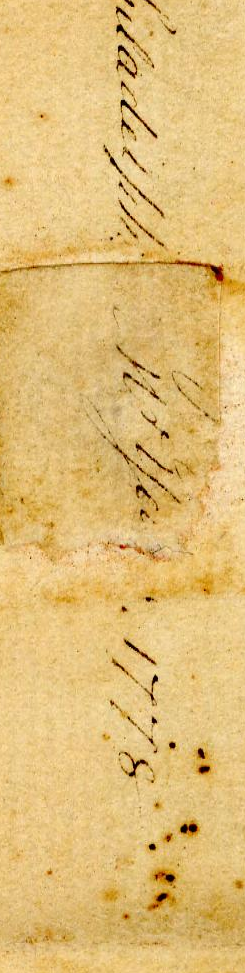M^r Yea- 1778
